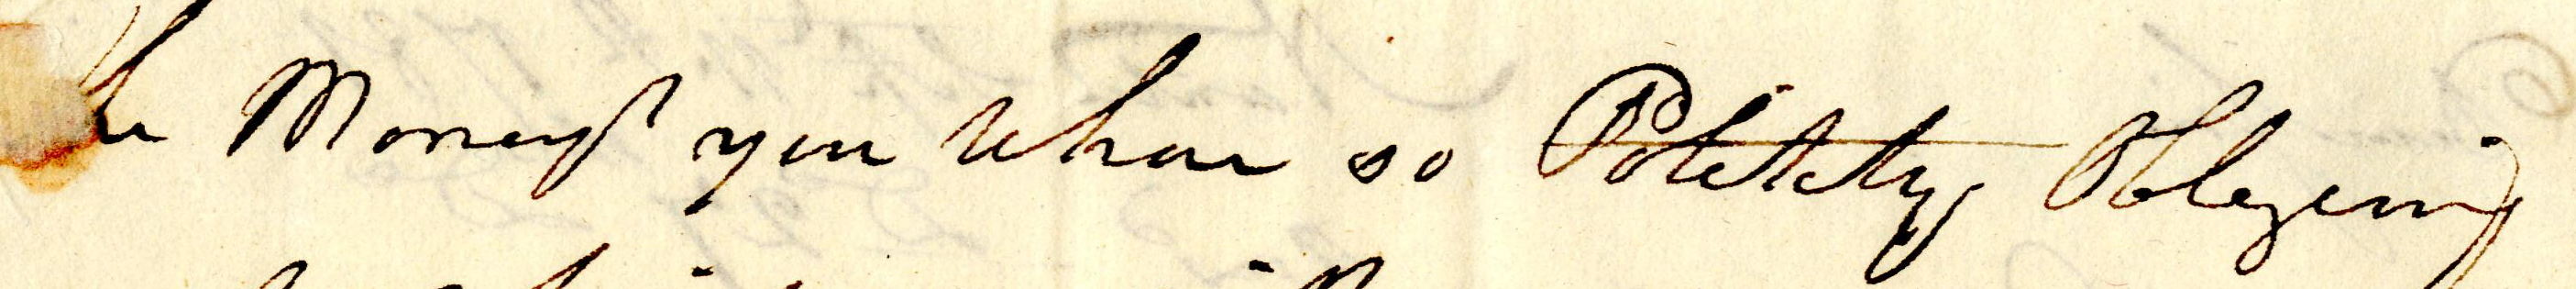[_]he Money you Whar so Politely Obliging
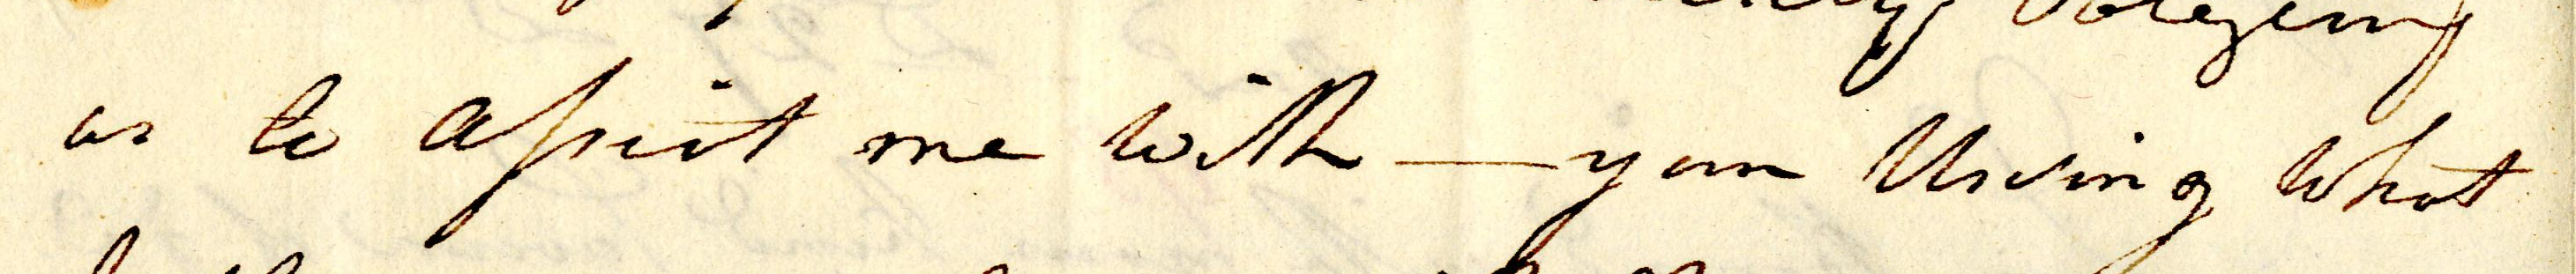as to assist me with- you Ussing what
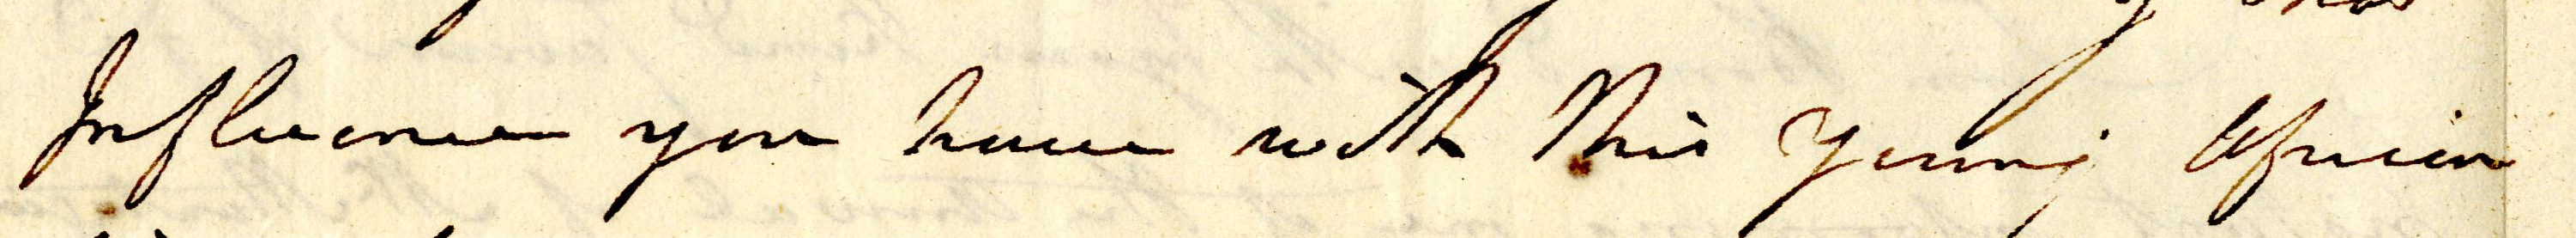Influence you have with this young African
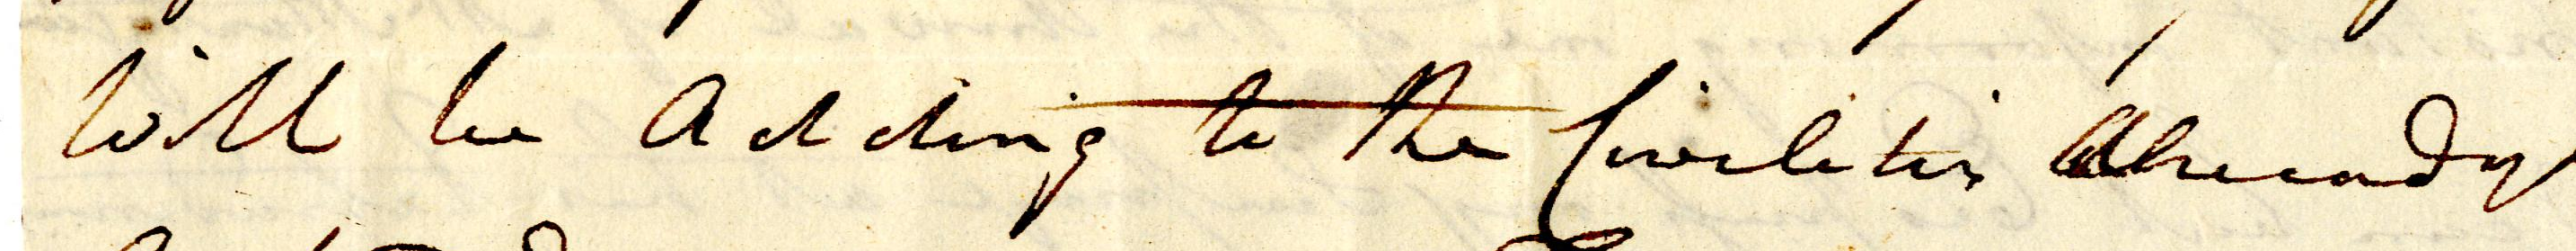Will be Adding to the Civilities Already
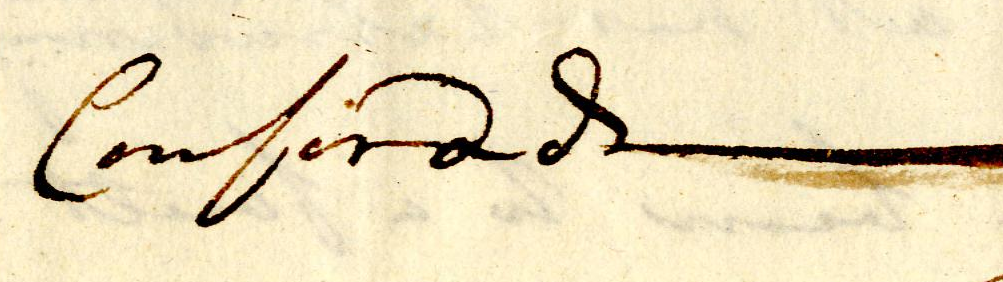Confird &-
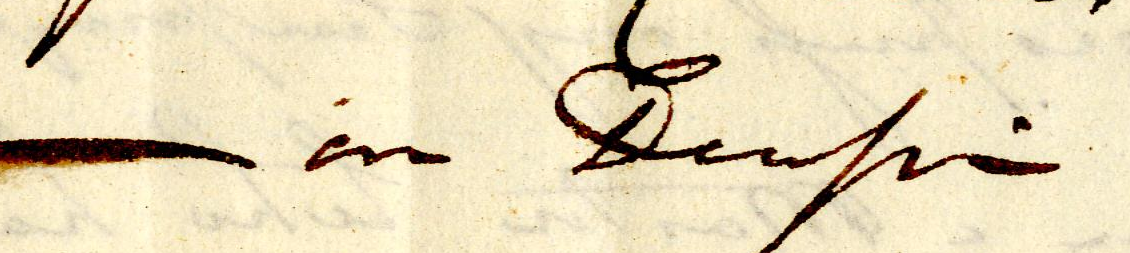on Dear Sir
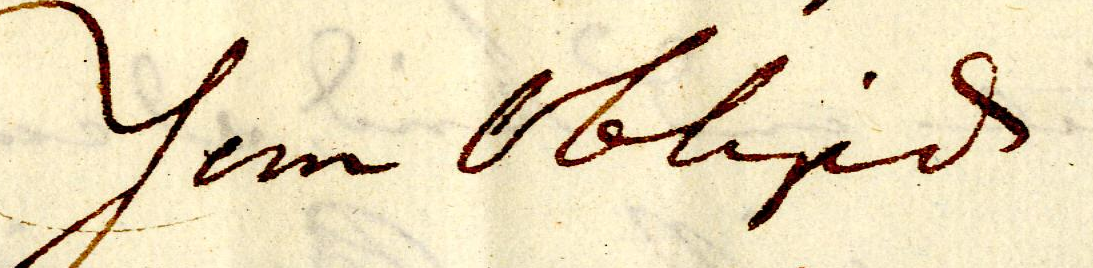your Obliged
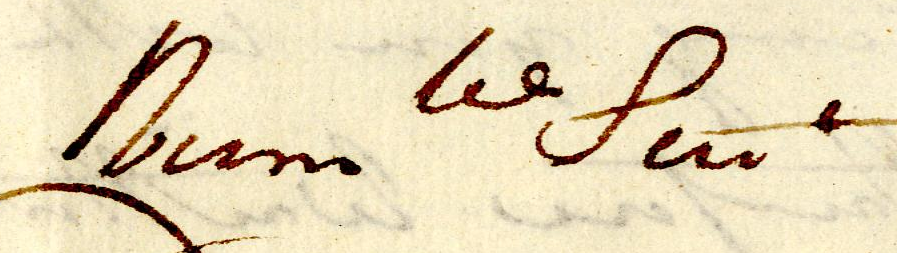Hum^bl Serv^t
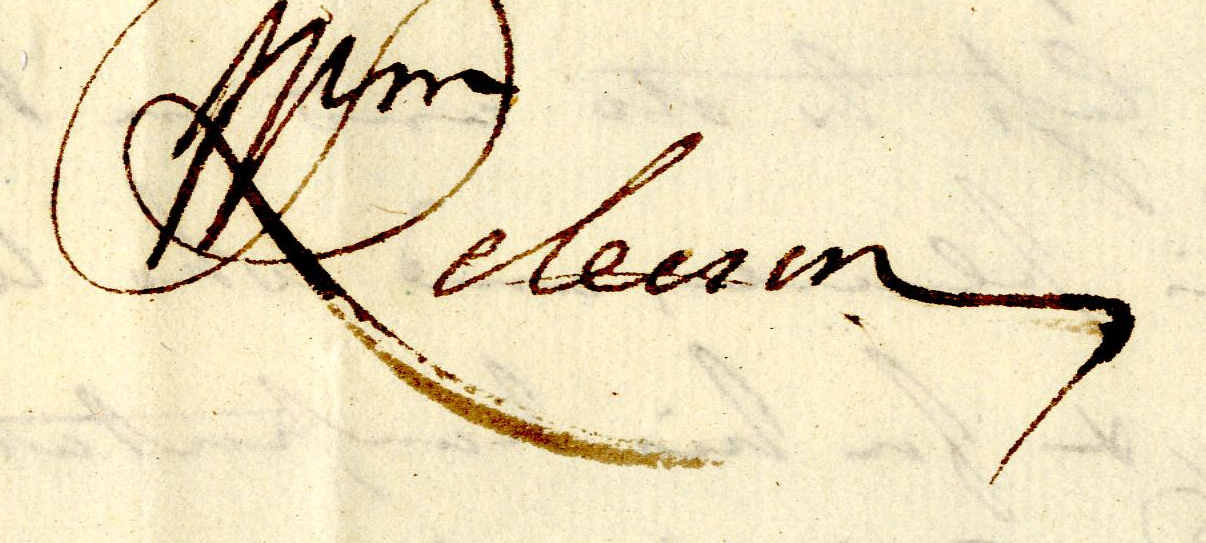W^m Robeson
